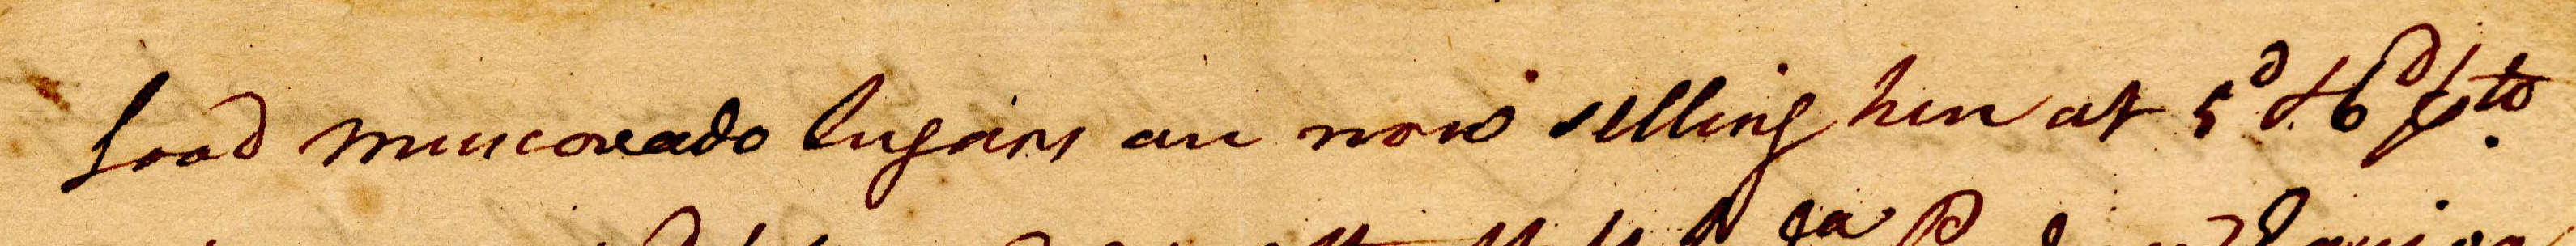good muscovado bargains are now selling here at 5^d & 6^d per ^lb.
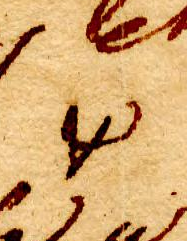&
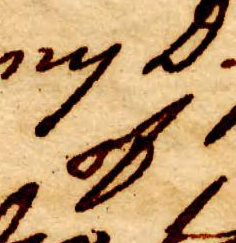of
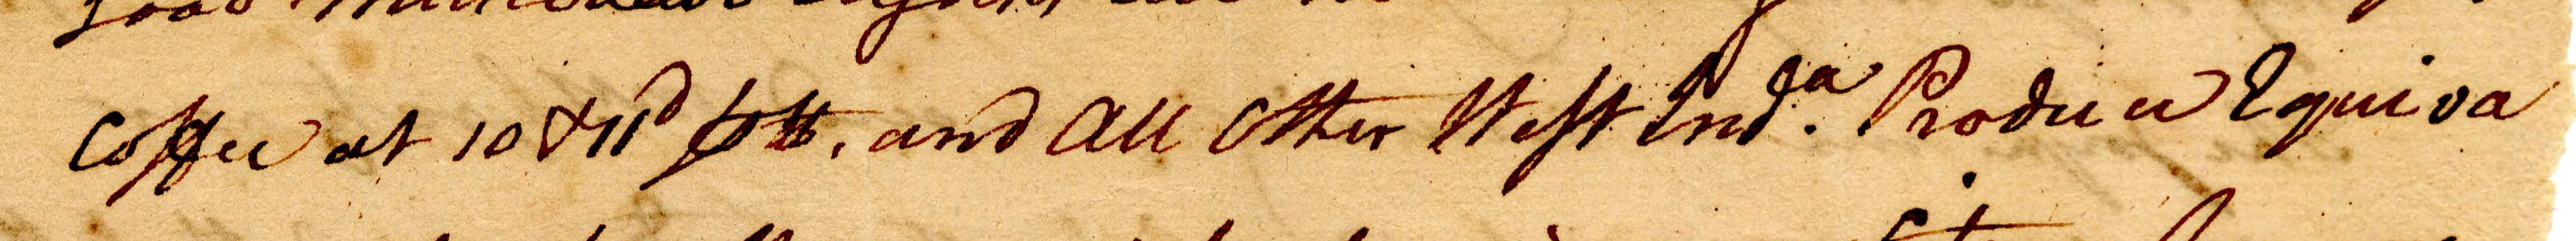coffee at 10 & 11^d per ^lb. and All other West Ind^a. Produce Equiva-
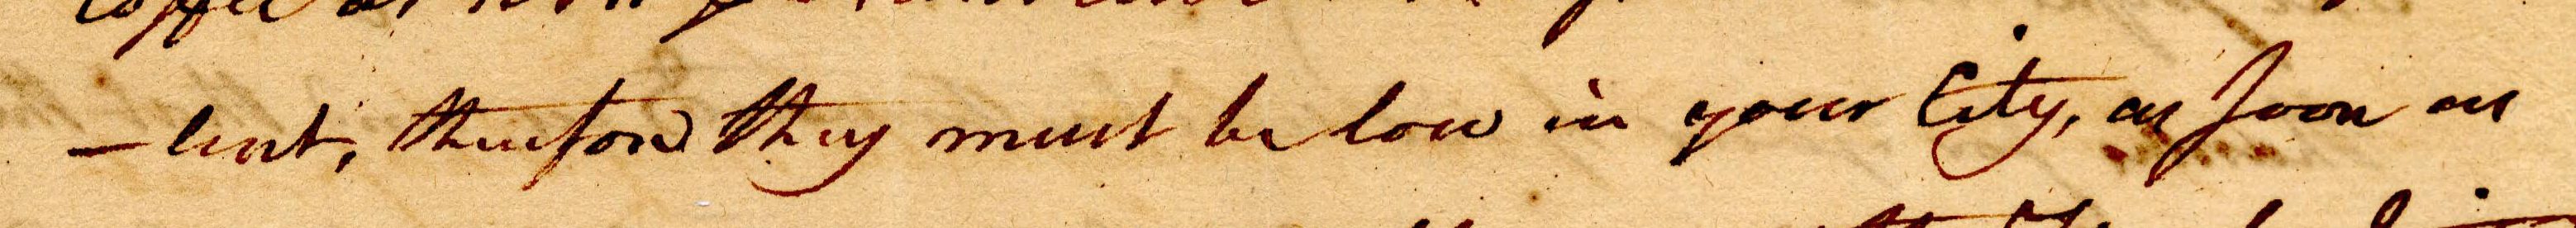-lent, therefore they must be low in your City, as soon as
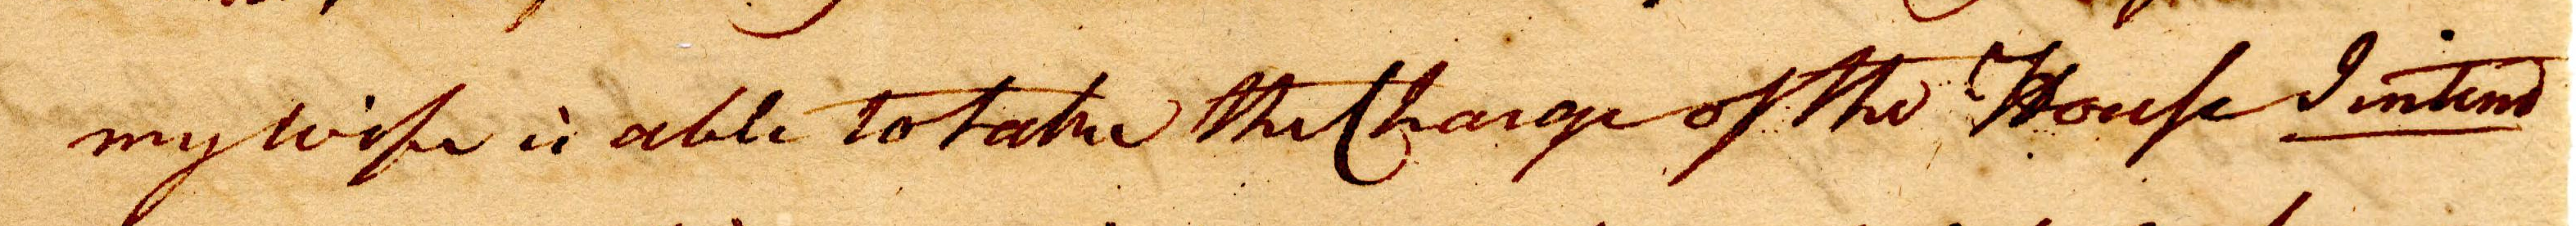to take a Ride to Midletown, & see if will Answer
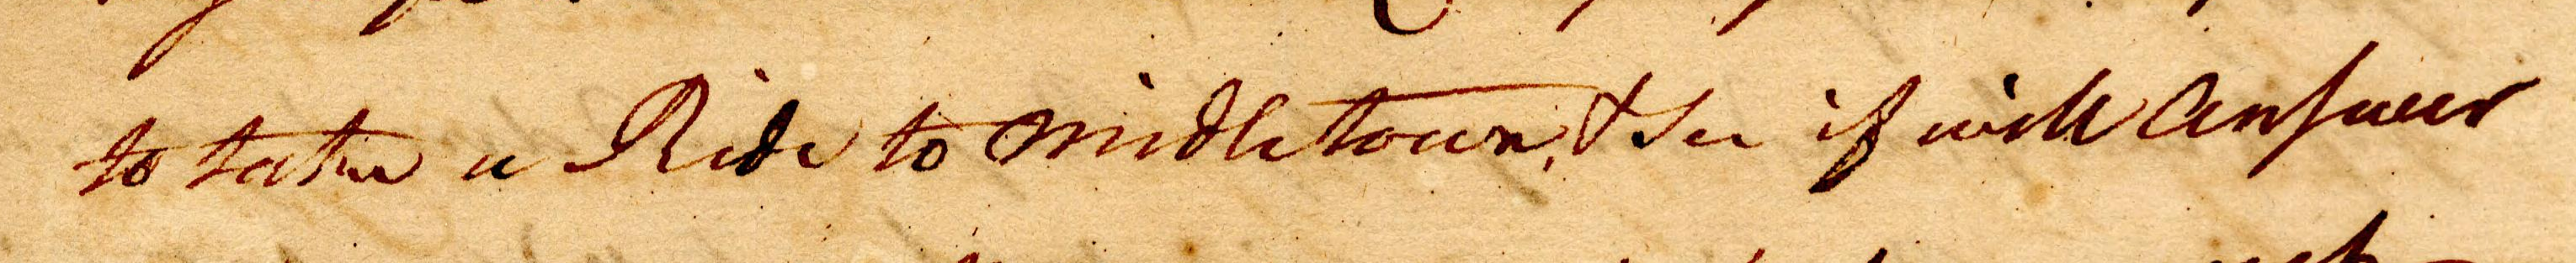to take a Ride to Midletown, & see if will Answer
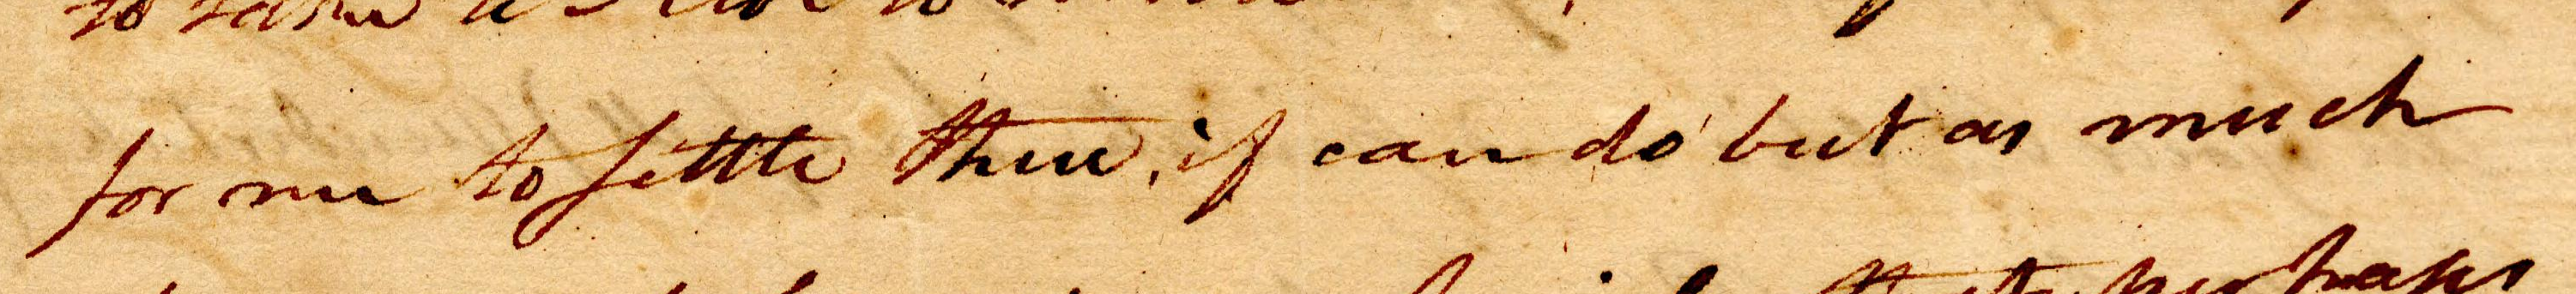for me to settle there, if can do but as much
